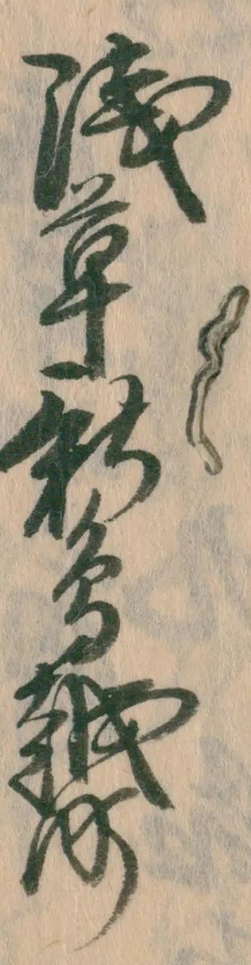浅草新鳥越町
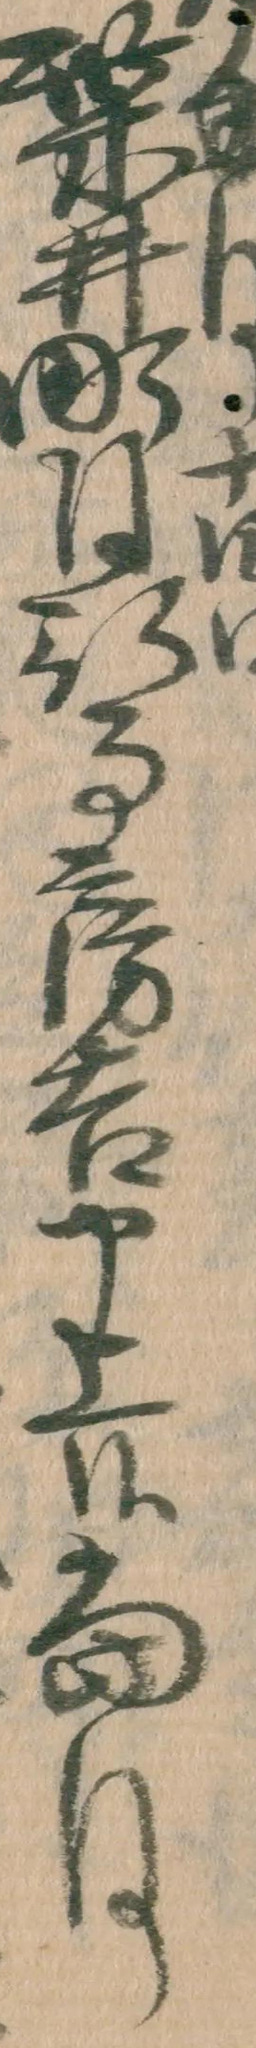一柴井町月行事房吉申上候当月
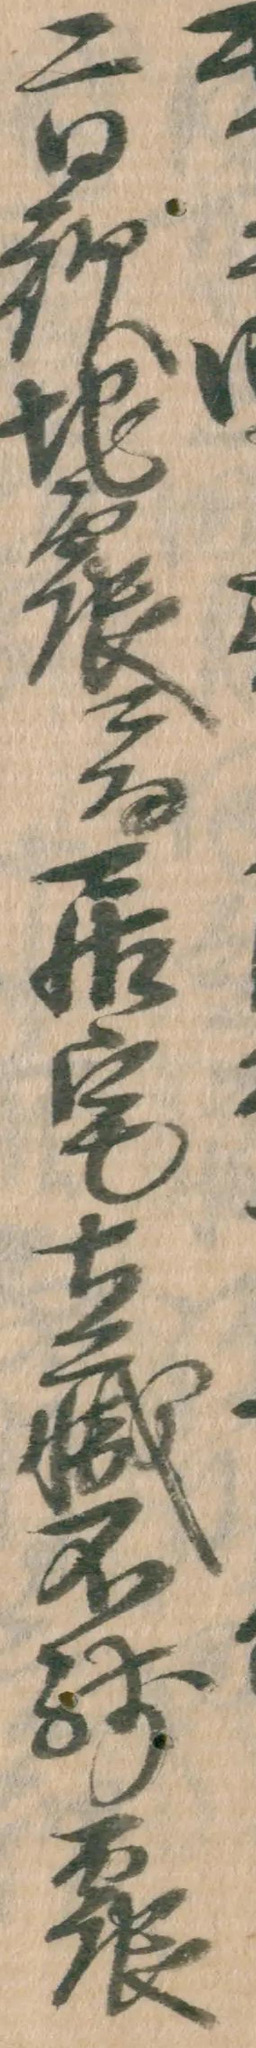二日夜地震ニ而居宅土蔵不残震
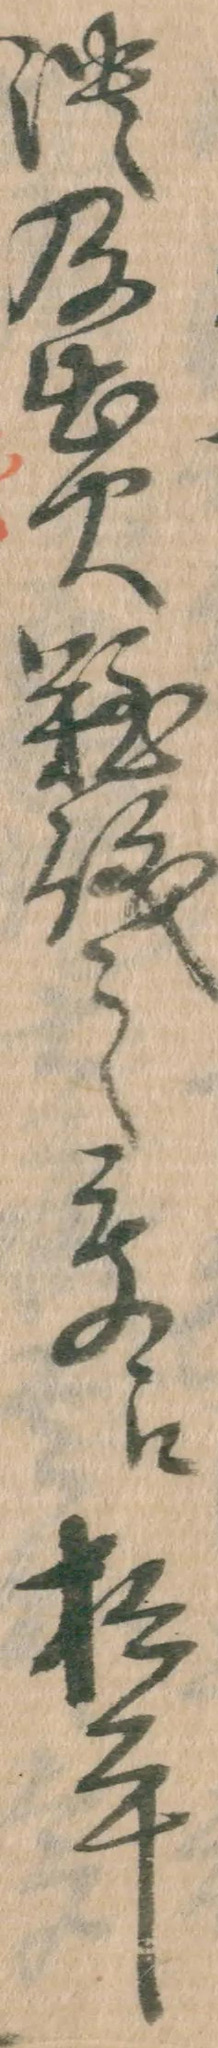潰及出火難儀之ものえ松平
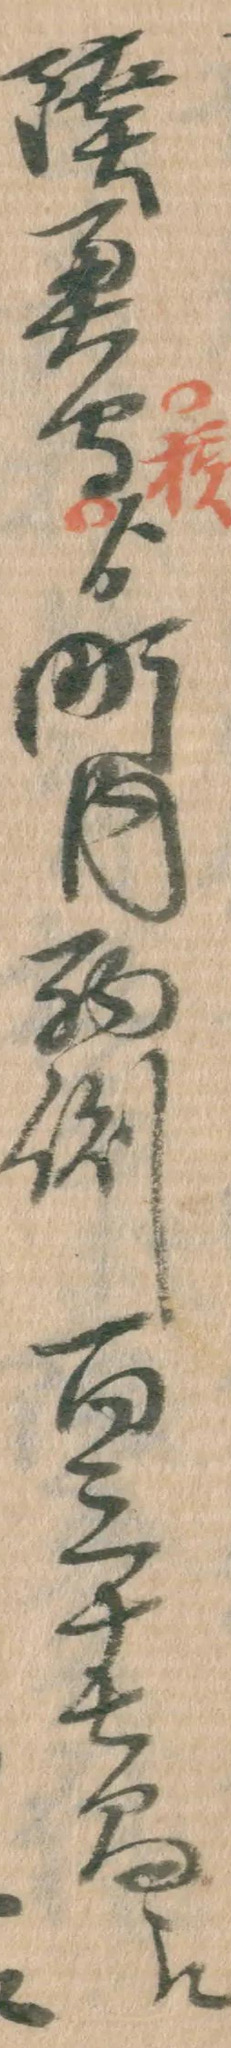陸奥守様ゟ町内西側百三十七間え
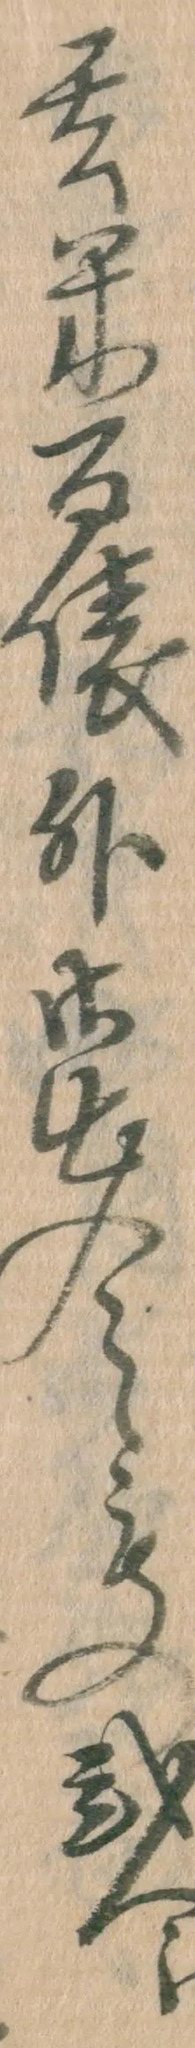玄米百俵外御出入之もの弐人え
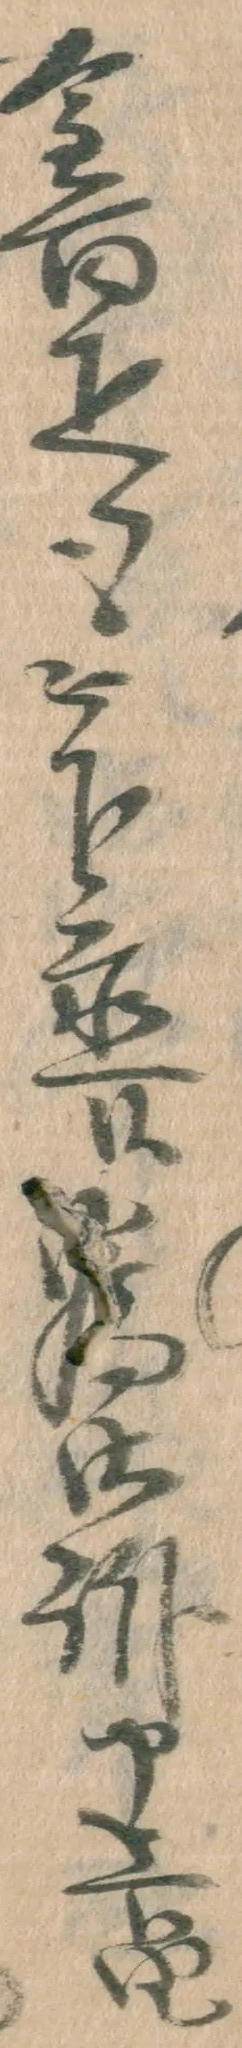金百疋ツヽ被下置候為御訴申上候由
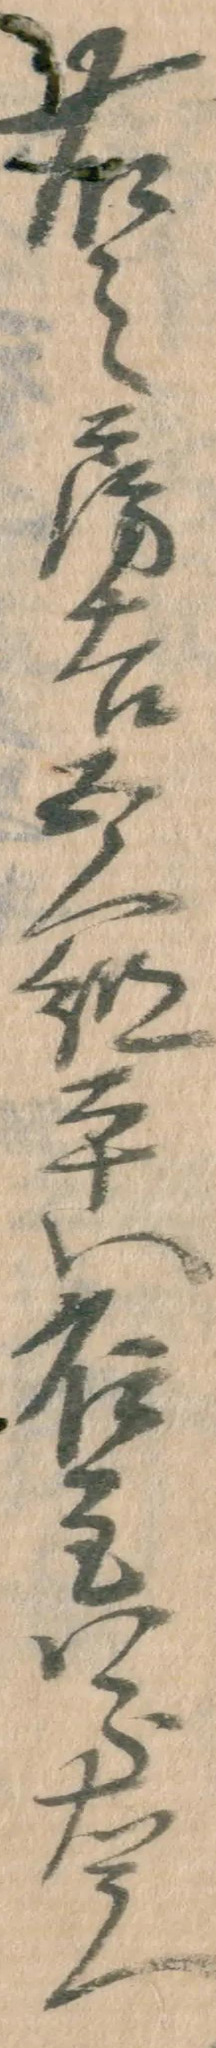右之房吉五人組平八名主八郎右衛門

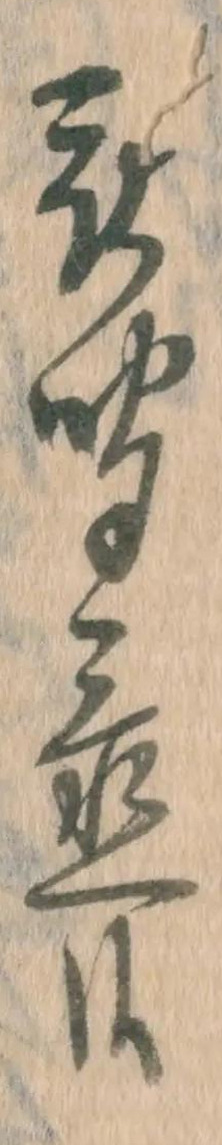被聞置候
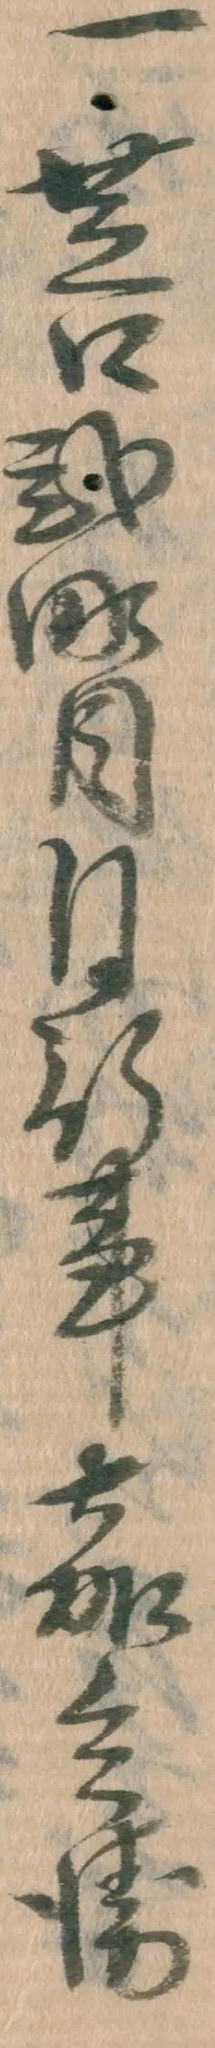一芝口弐町目月行事嘉兵衛
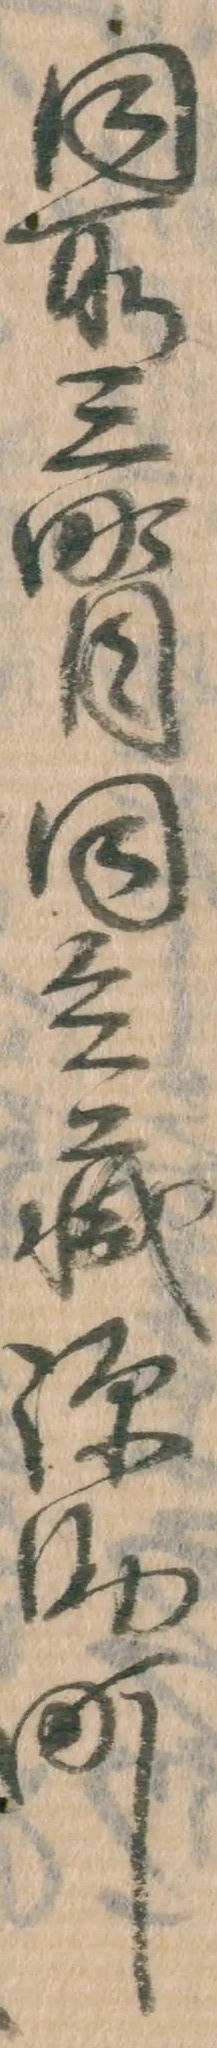同所三町目同兵蔵源助町
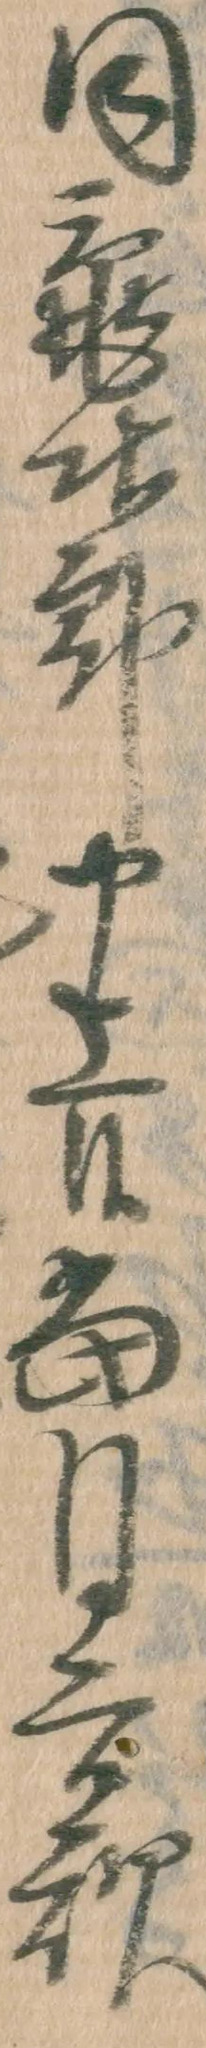同亀次郎申上そろ当月二日夜
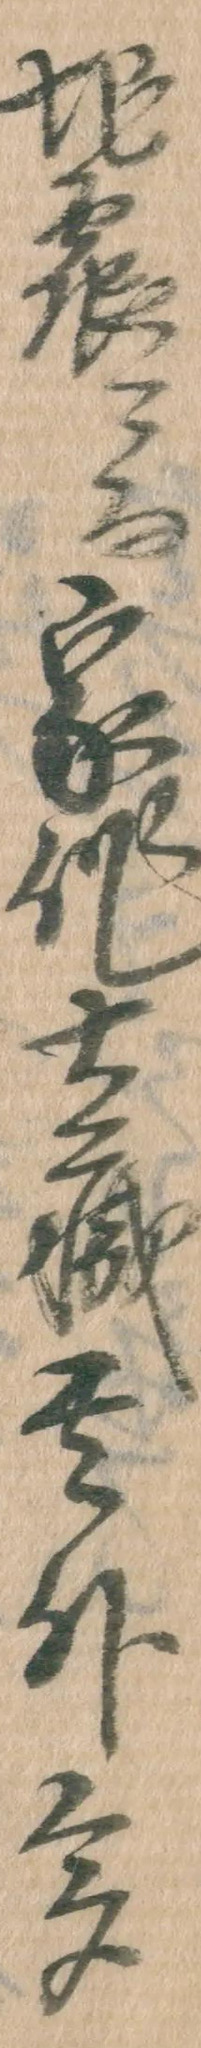地震ニ而家作土蔵其外多
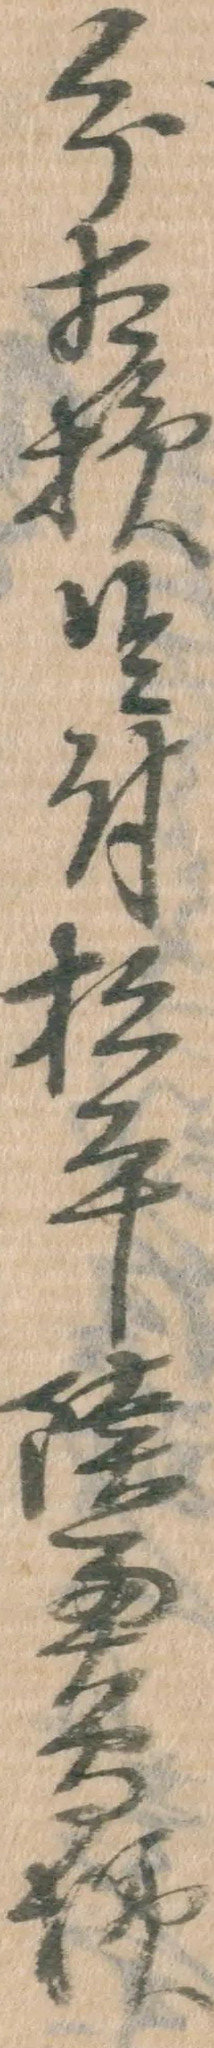分相損候ニ付松平陸奥守様
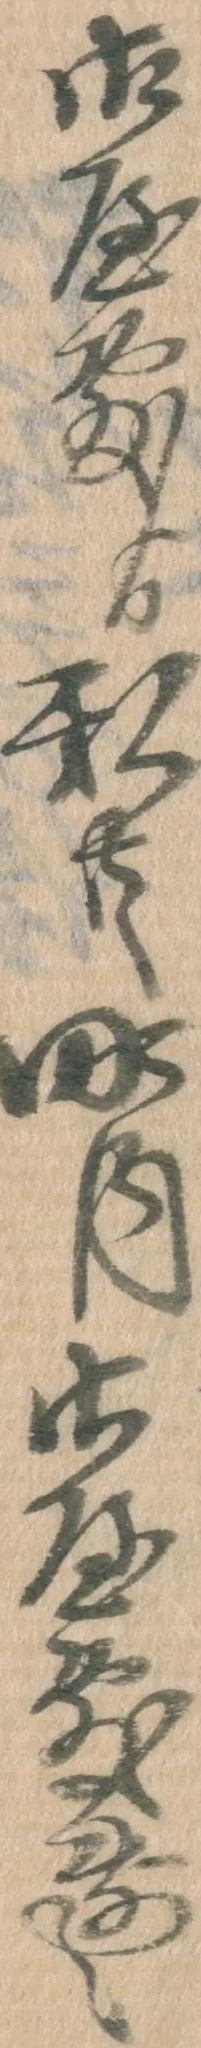御屋敷ゟ私共町内御屋敷前之
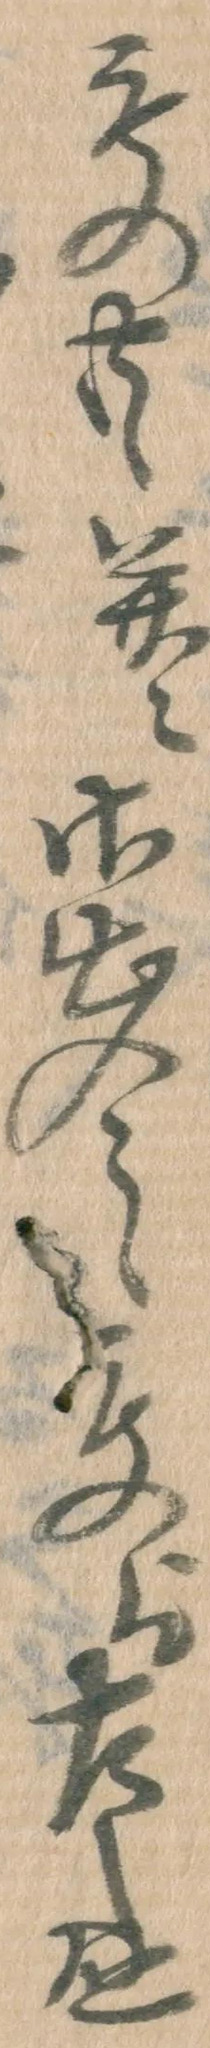もの共并ニ御出入之ものえ左之通
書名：武家方并寺院等ニテ施差出候一件
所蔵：国立国会図書館 National Diet Library, JAPAN
